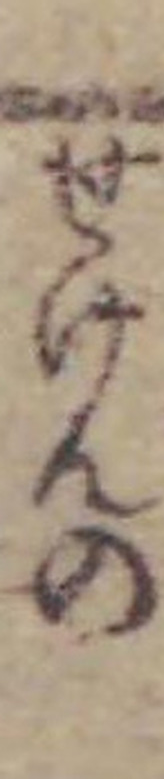せけんの
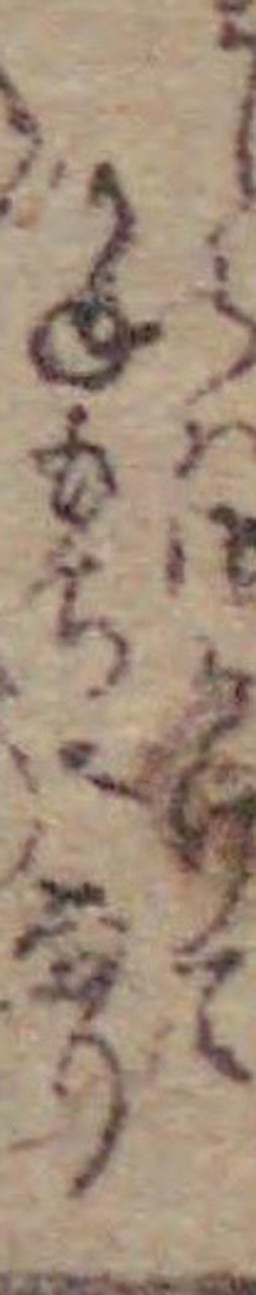かねもちになり
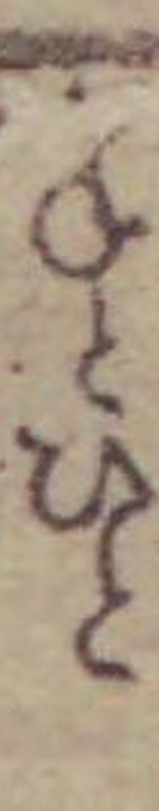かねとひと
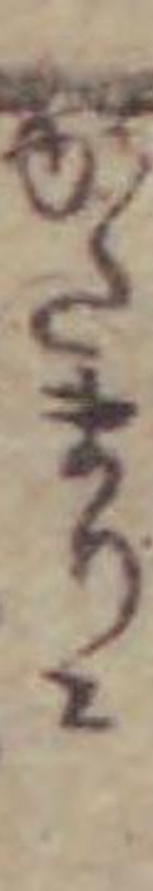かたまりに
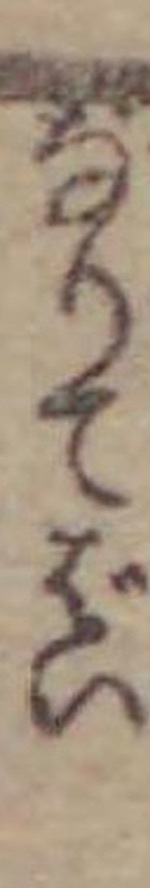なりてばい
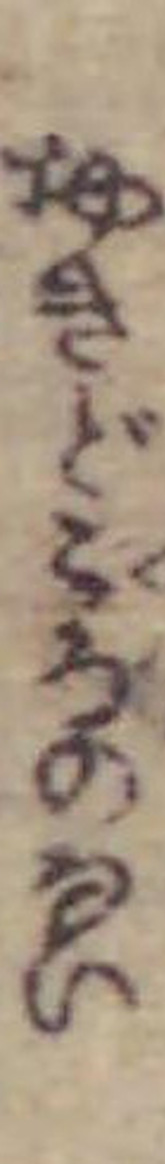おきどころのない
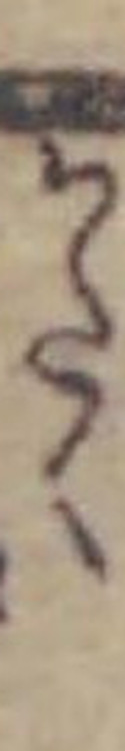がたく
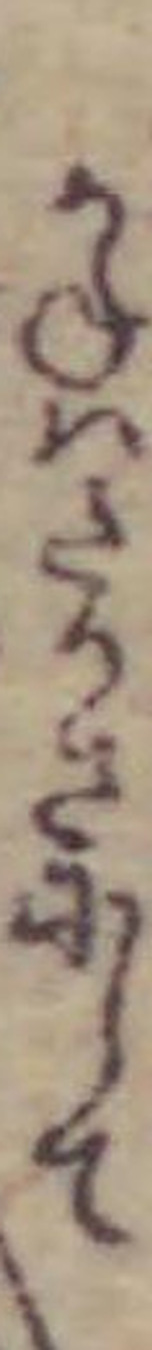かねはたかさにして
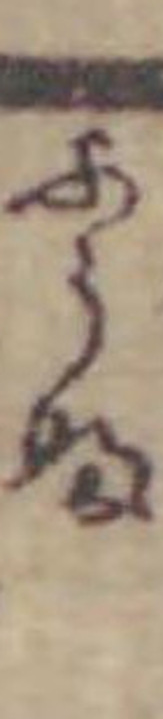ふうふ
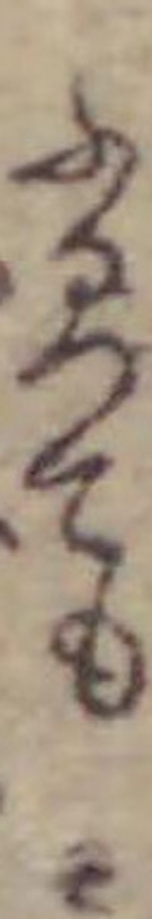ふるつても
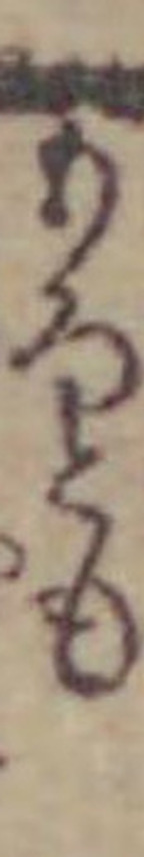もろとも
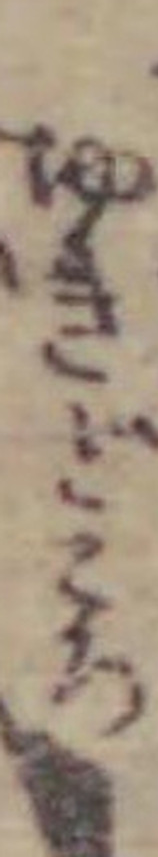おきどころ
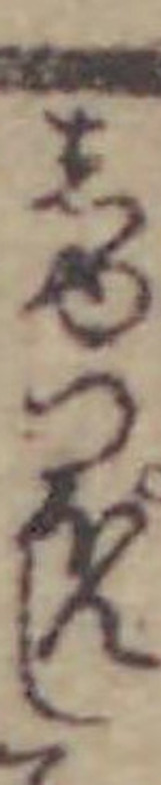しゆつぽんして
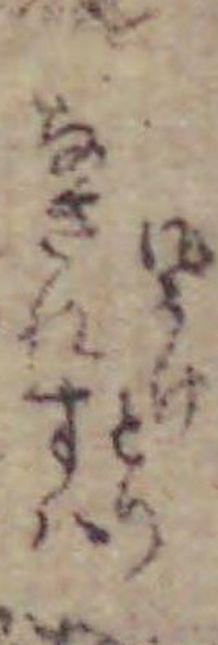なされすは
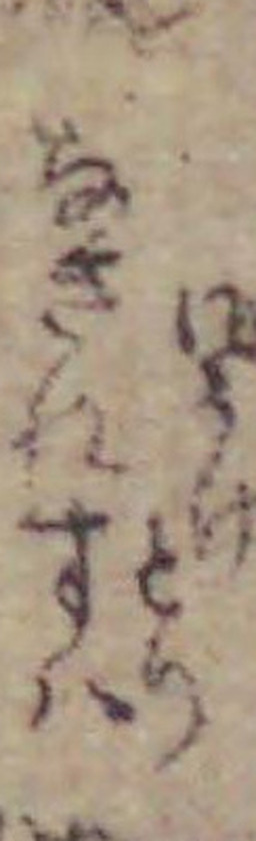なされすは
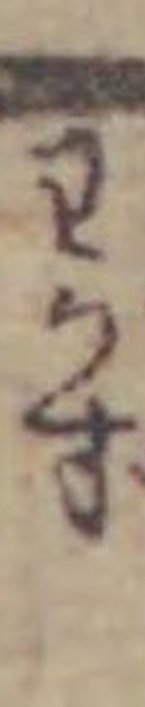わかず
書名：莫切自根金生木 : 3巻
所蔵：国立国会図書館 National Diet Library, JAPAN
